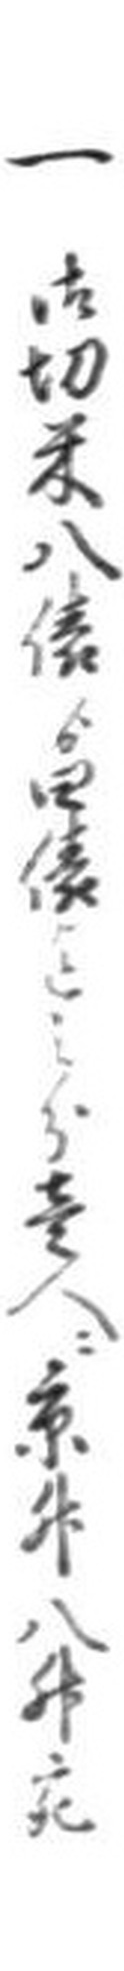一御切米八俵ゟ四俵迄之分壱人ニ京升八升宛
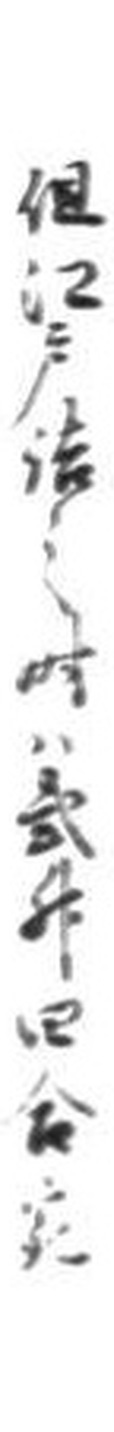但江戸詰之時ハ弐升四合宛

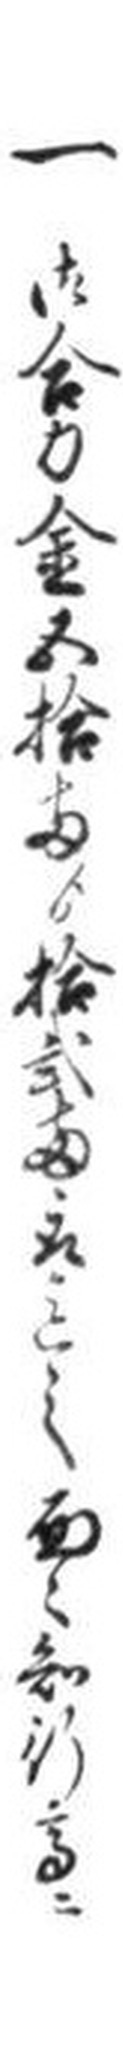一御合力金五拾両ゟ拾弐両取迄之面々知行高ニ
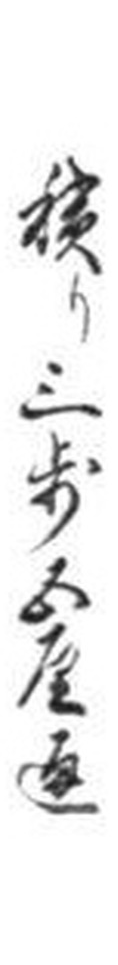積り三歩五厘通
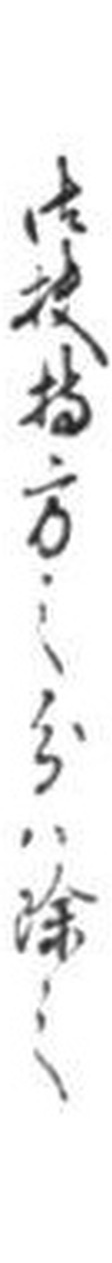御扶持方之分ハ除之
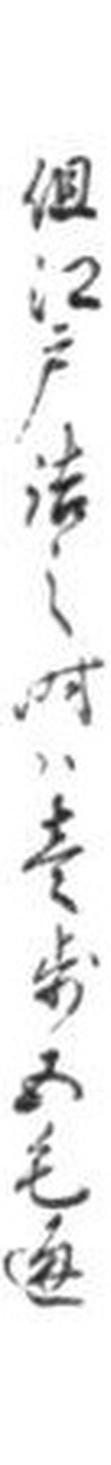但江戸詰之時ハ壱歩五毛通
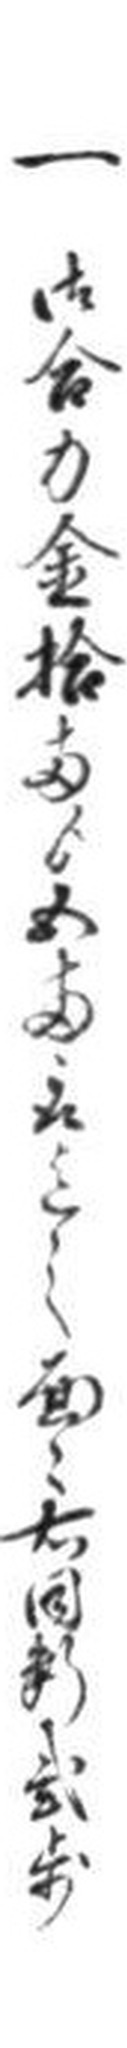一御合力金拾両ゟ五両取迄之面々右同断弐歩
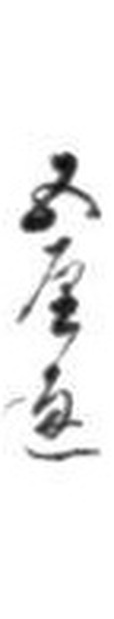五厘通
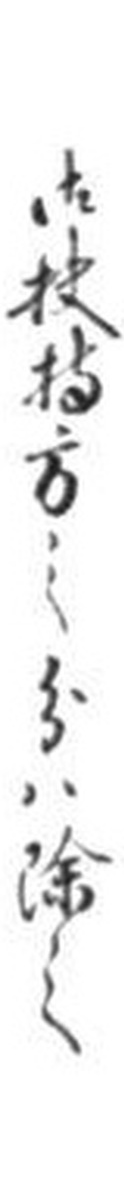御扶持方之分ハ除之
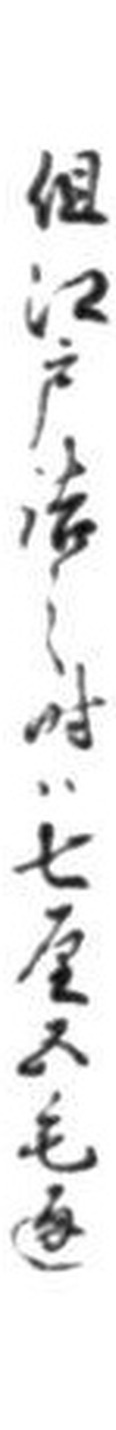但江戸詰之時ハ七厘五毛通
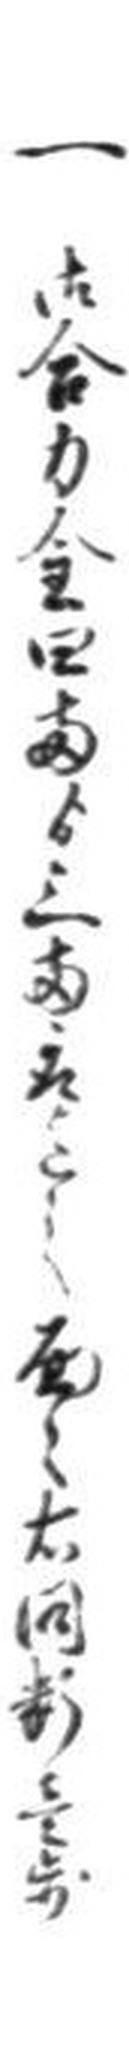一御合力金四両ゟ三両取迄之面々右同断壱歩
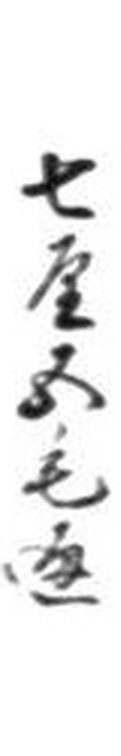七厘五毛通
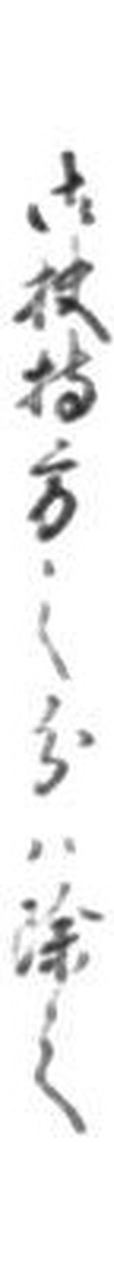御扶持方之分ハ除之
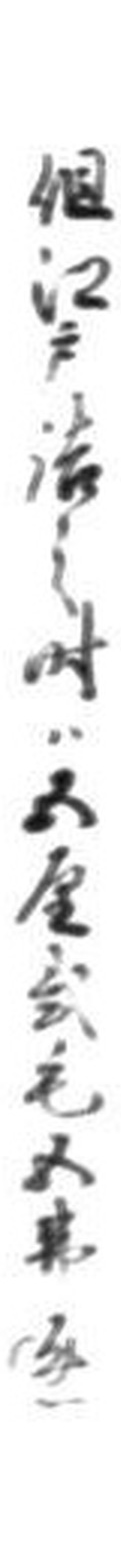但江戸詰之時ハ五厘弐毛五弗通
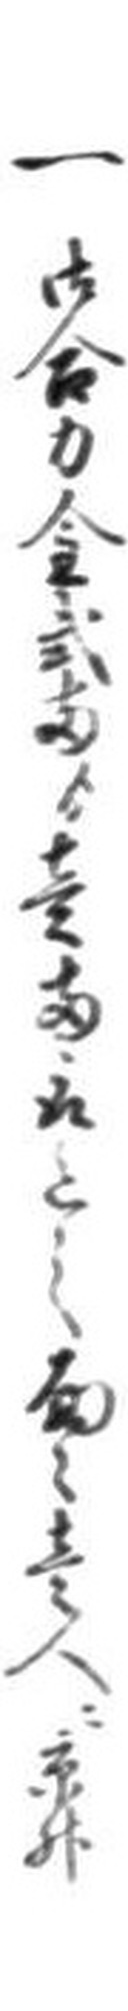一御合力金弐両ゟ壱両取迄之面々壱人ニ京升
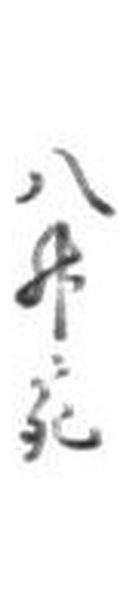八升宛
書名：家譜 三十八 宗矩公 従享保九年五月到享保九年十二月
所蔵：福井県文書館 Fukui Prefectural Archives
